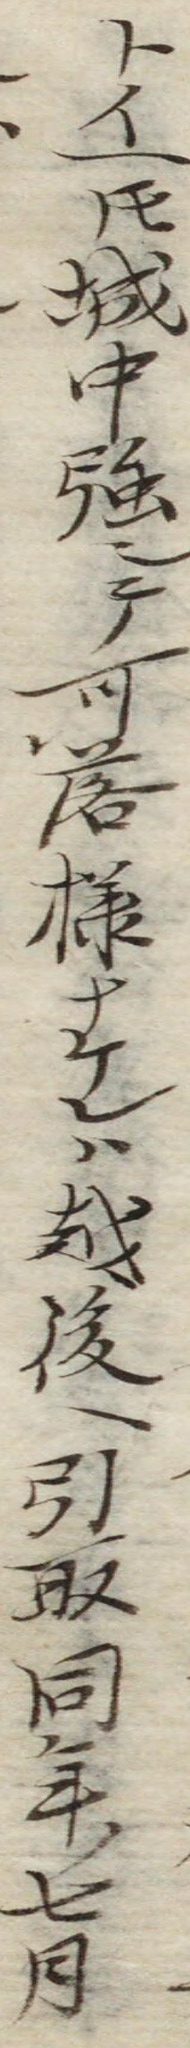トイヘトモ城中強シテ可落様ナケレハ越後ヘ引取同年ノ七月
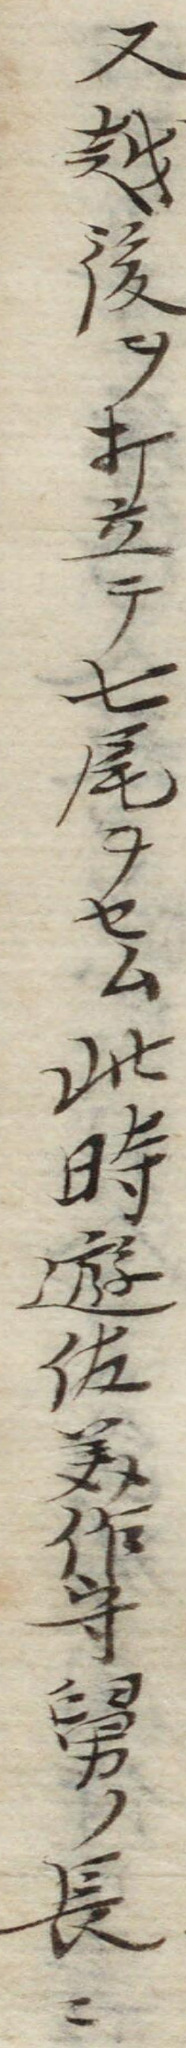又越後ヲ打立テ七尾ヲセム此時遊佐美作守舅ノ長ニ

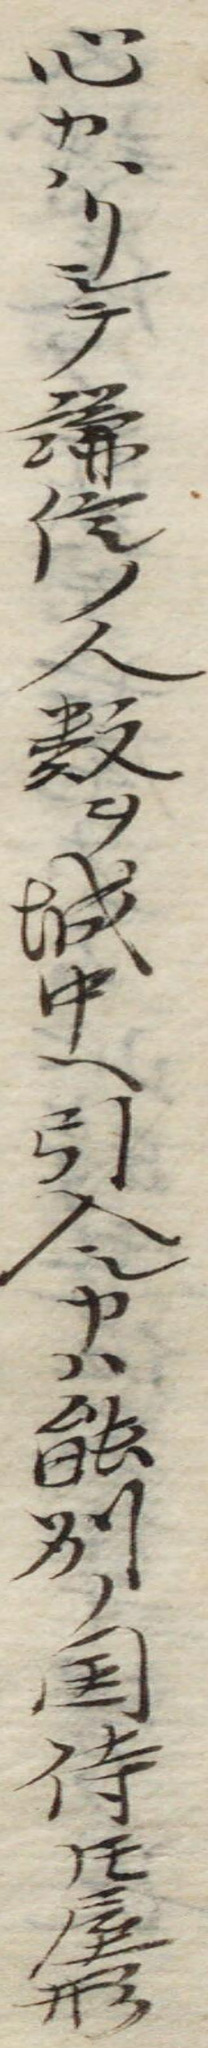心カハリシテ謙信ノ人数ヲ城中ヘ引入シカハ能州ノ国侍トモ屋形
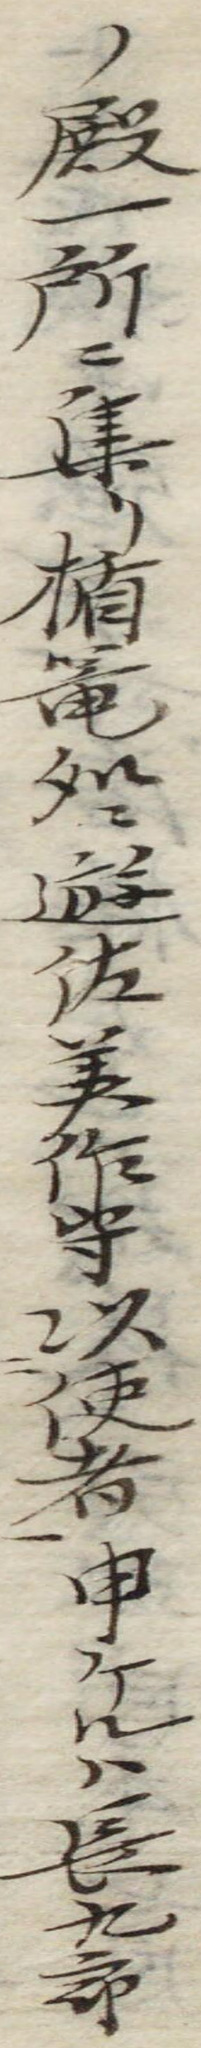ノ殿一所ニ集リ楯籠処ニ遊佐美作守以使者申ケルハ長九郎
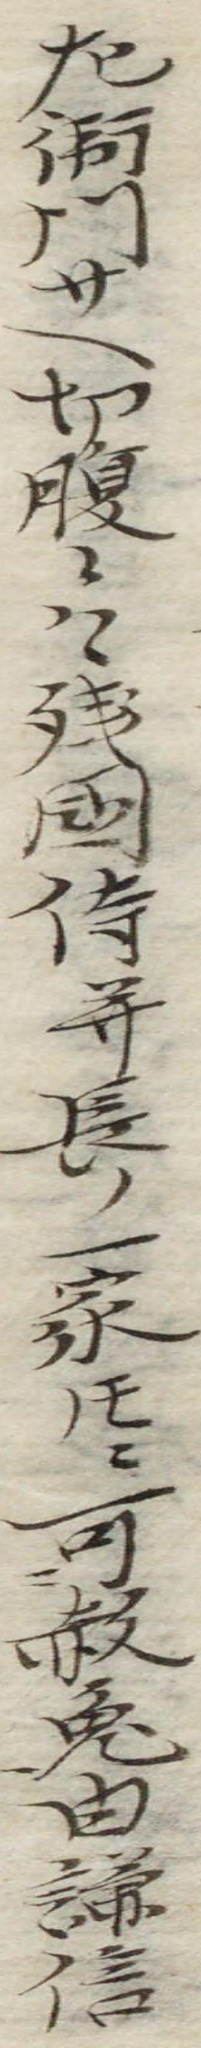左衛門サヘ切腹候ハ丶残国侍并長ノ一家トモニ可赦免由謙信
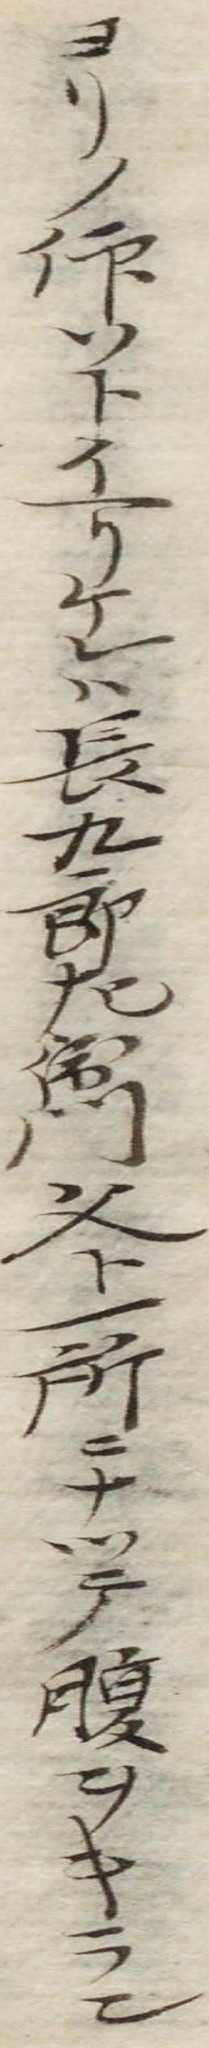ヨリノ仰ソトイヘリケレハ長九郎左衛門父ト一所ニナツテ腹ヲキラン
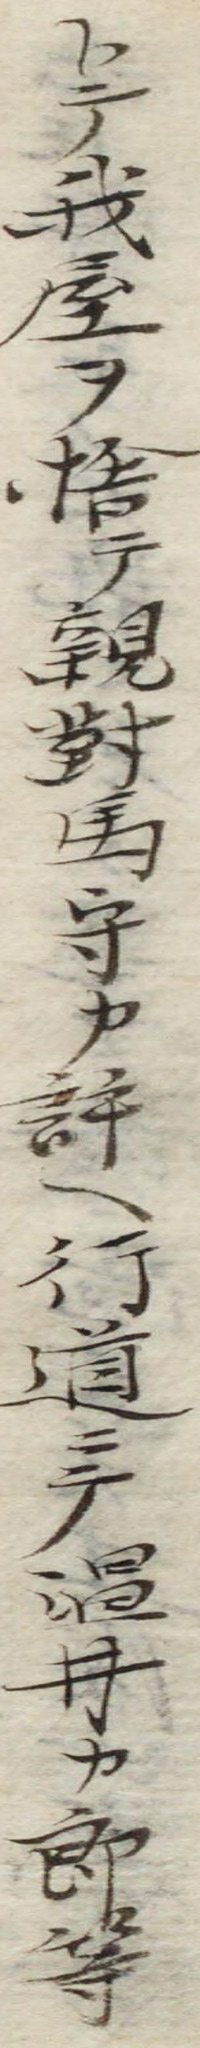トテ我屋ヲ捨テ親對馬守カ許ヘ行道ニテ温井カ郎等
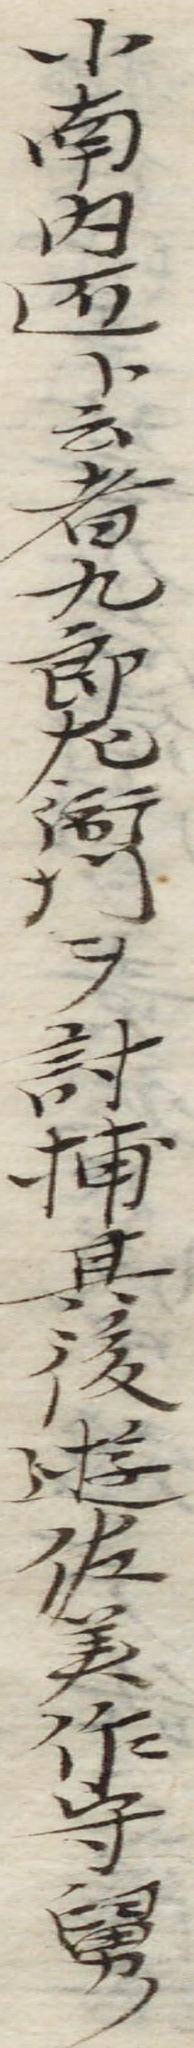小南内近ト云者九郎左衛門ヲ討捕其後遊佐美作守舅ノ
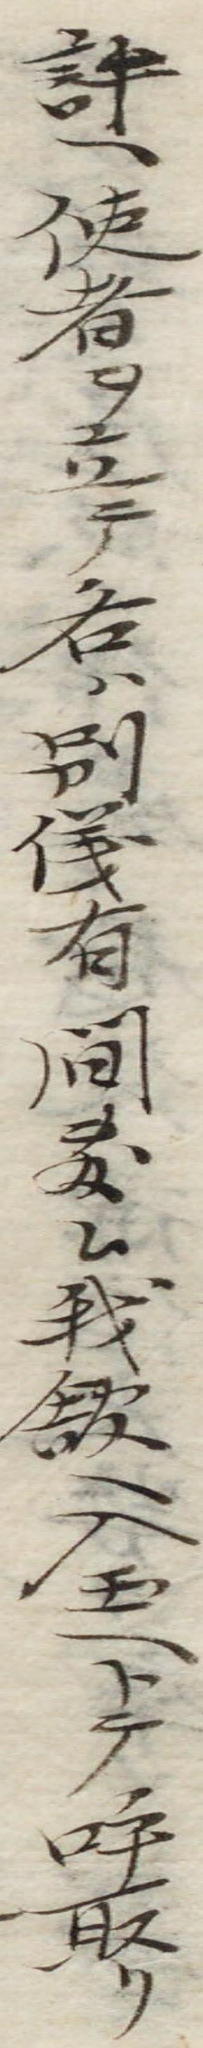許へ使者ヲ立テヽ右ハ別儀有間敷候我館へ入玉ヘトテ呼取リ
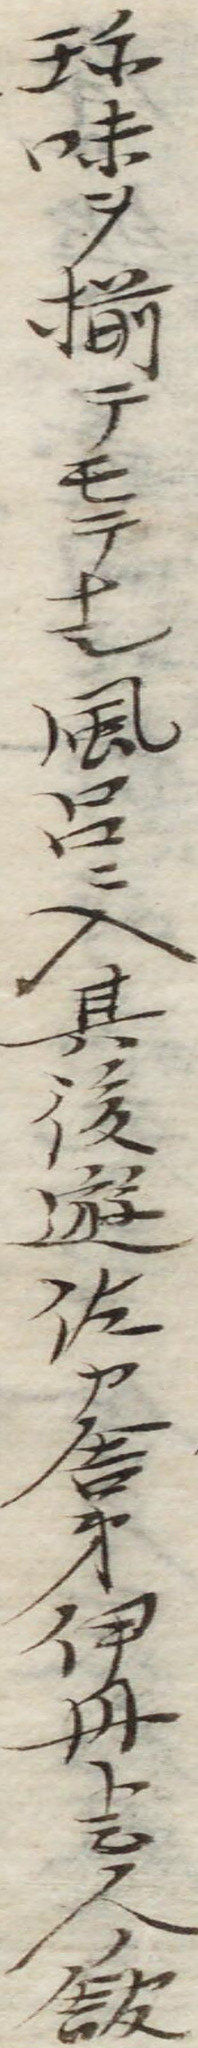珍味ヲ揃テモテナシ風呂ニ入其後遊佐カ舎弟伊丹ト云人ノ館
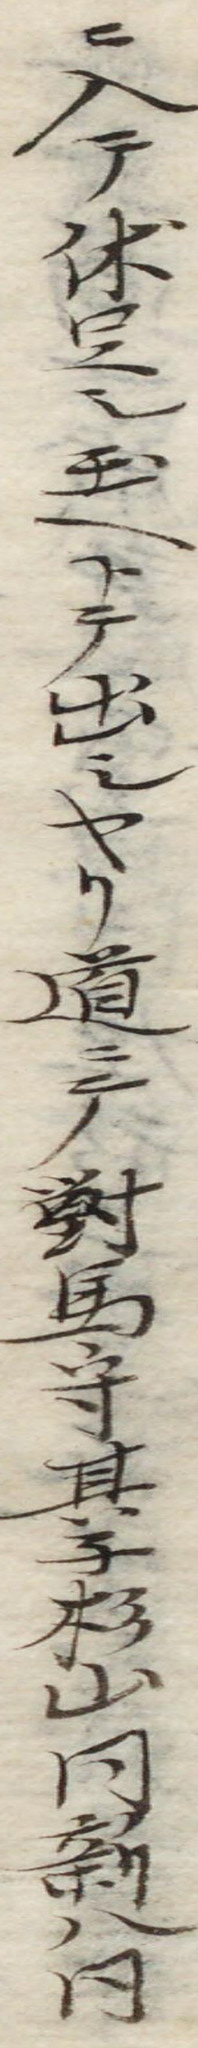ニ入テ休足シ玉ヘトテ出シヤリ道ニテ對馬守其子杉山同新八同
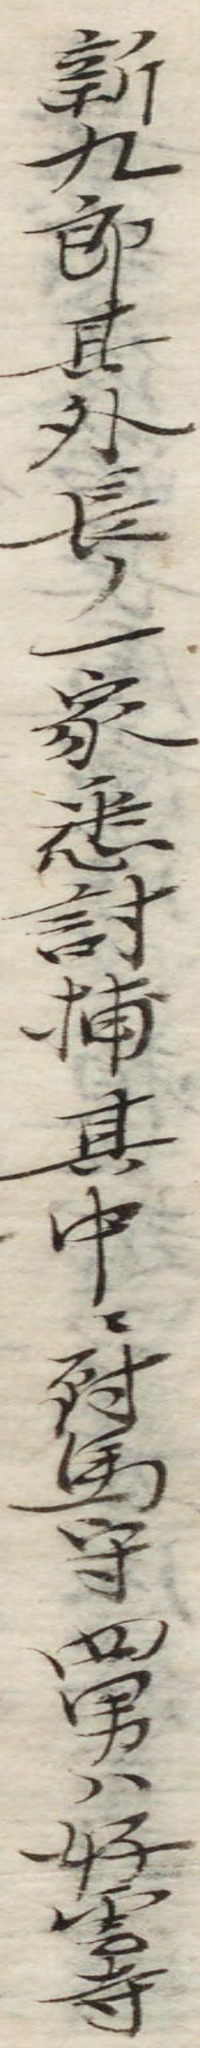新九郎其外長ノ一家悉討捕其中ニ對馬守四男ハ好雲寺
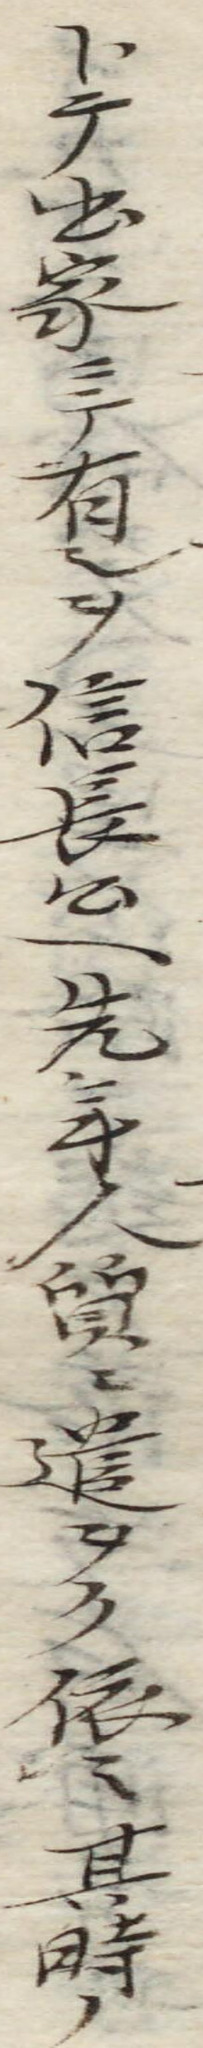トテ出家ニテ有シヲ信長公ヘ先年人質ニ遣ヲク依之其時ノ
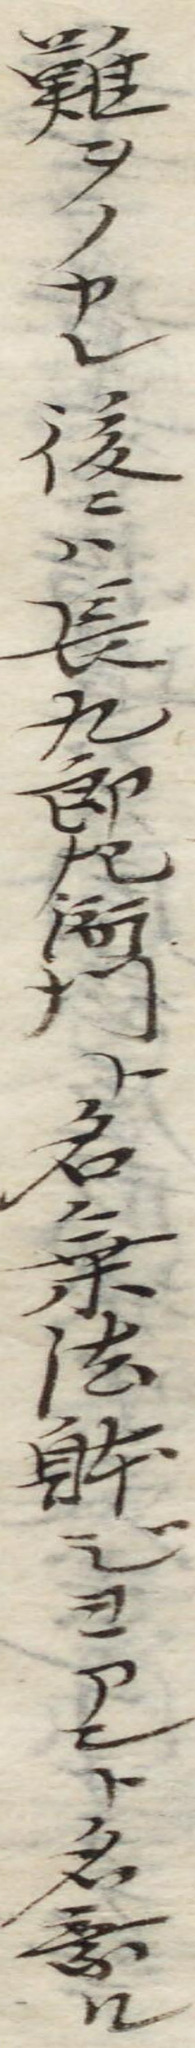難ヲノカレシ後ニハ長九郎左衛門ト名乗法躰ジヨアント名乗ル
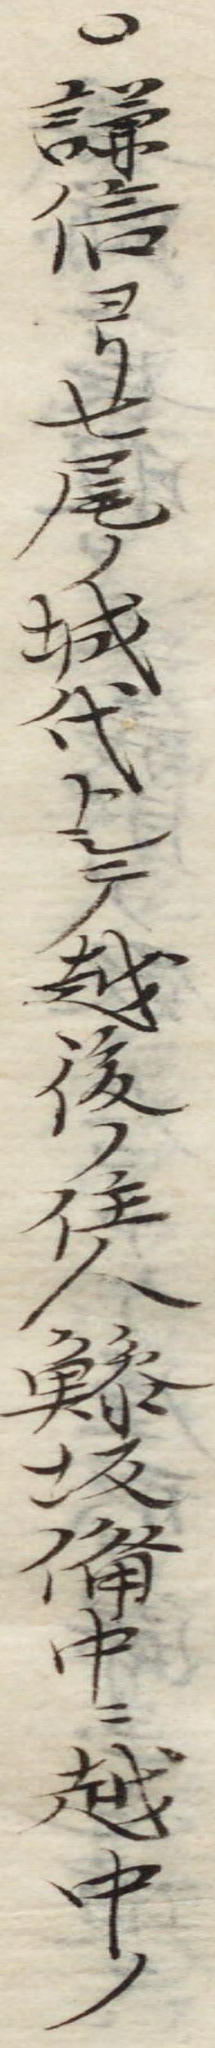〇謙信ヨリ七尾ノ城代トシテ越後ノ住人鰺坂備中ニ越中ノ
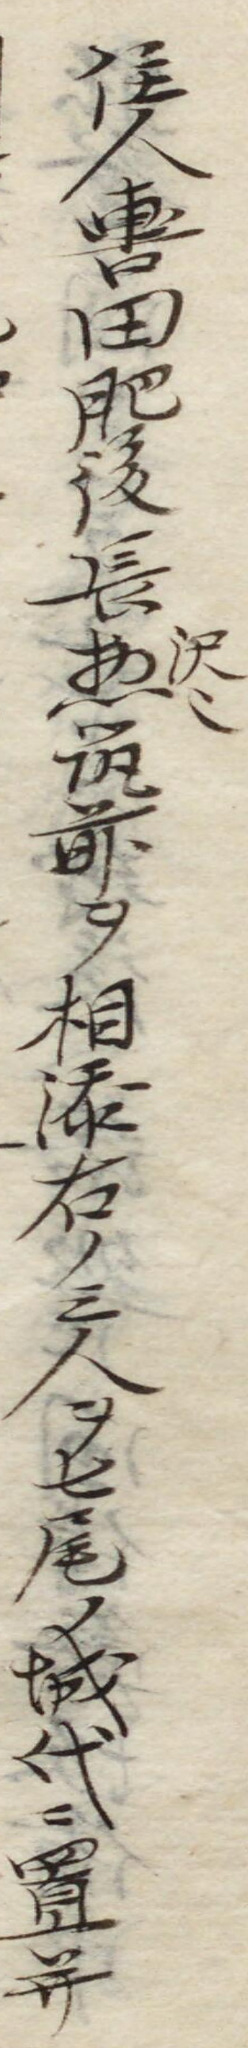住人響田肥後長惣筑前ヲ相添右ノ三人ヲ七尾ノ城代ニ置并
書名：聞見雑録
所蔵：Ishikawa Prefectural Library
